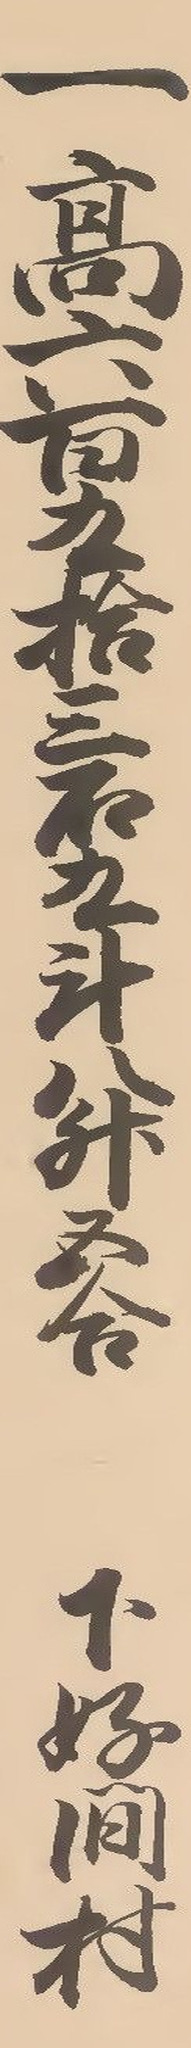一高六百九拾三石九斗八升五合下好間村
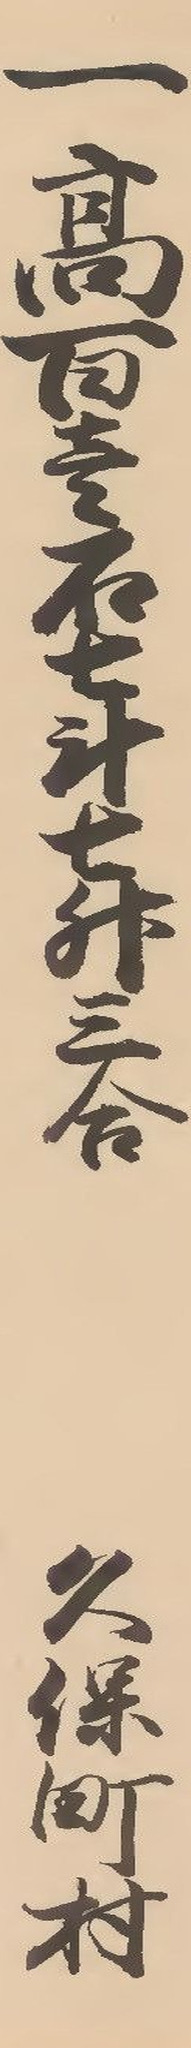一高百壱石七斗七升三合久保町村
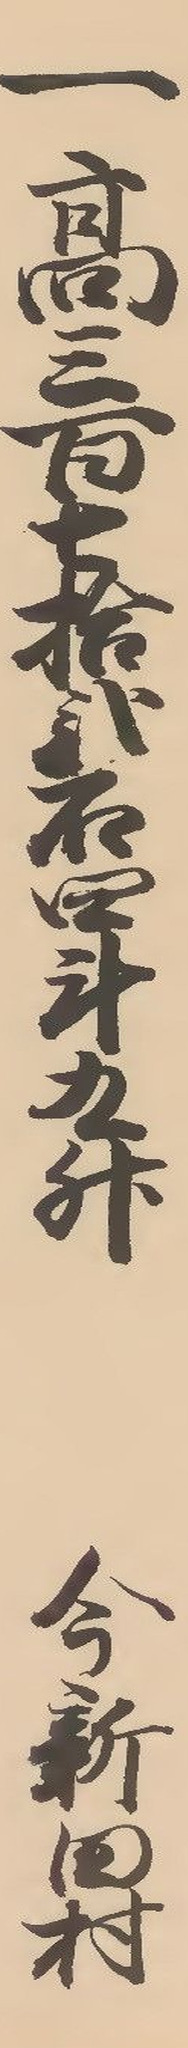一高三百七拾弐石四斗九升今新田村
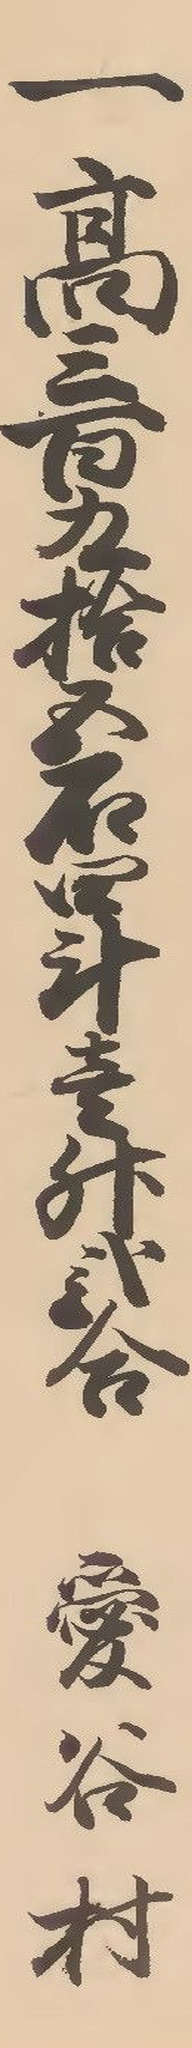一高三百九拾五石四斗壱升弐合愛谷村

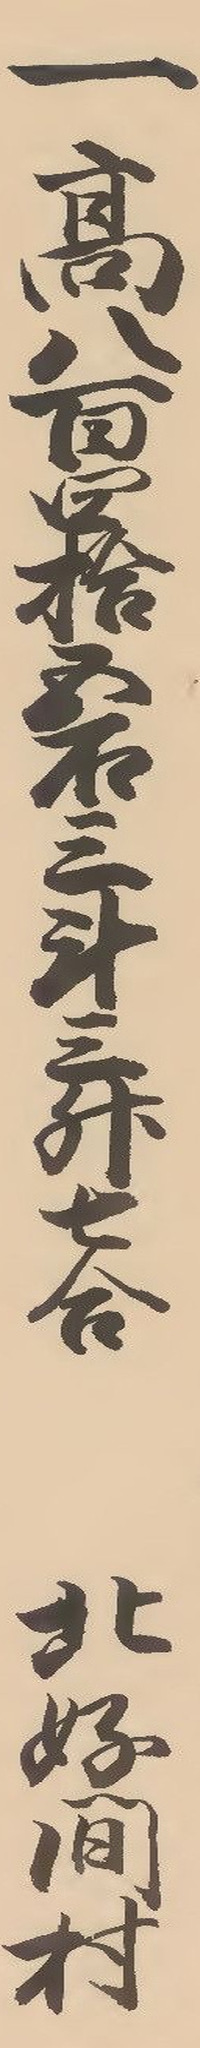一高八百四拾五石三斗三升七合北好間村
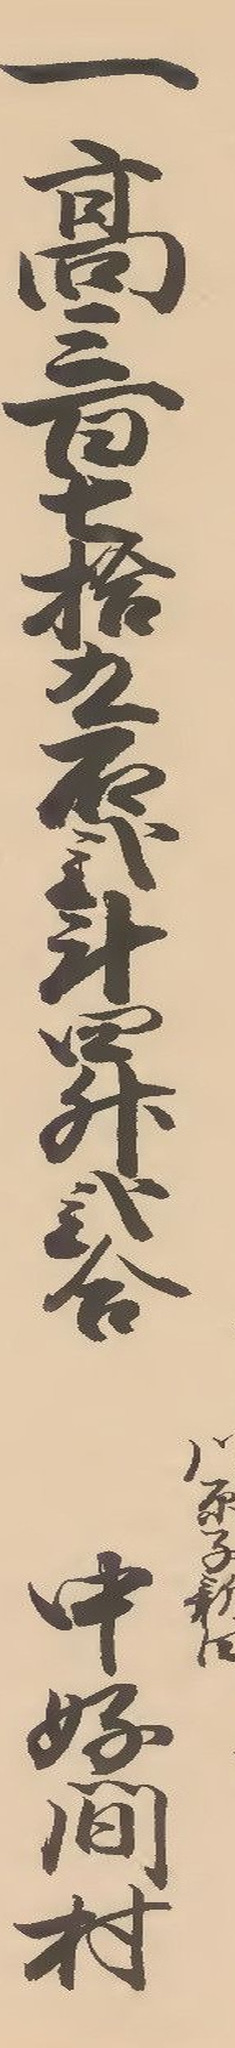一高三百七拾九石弐斗四升弐合中好間村
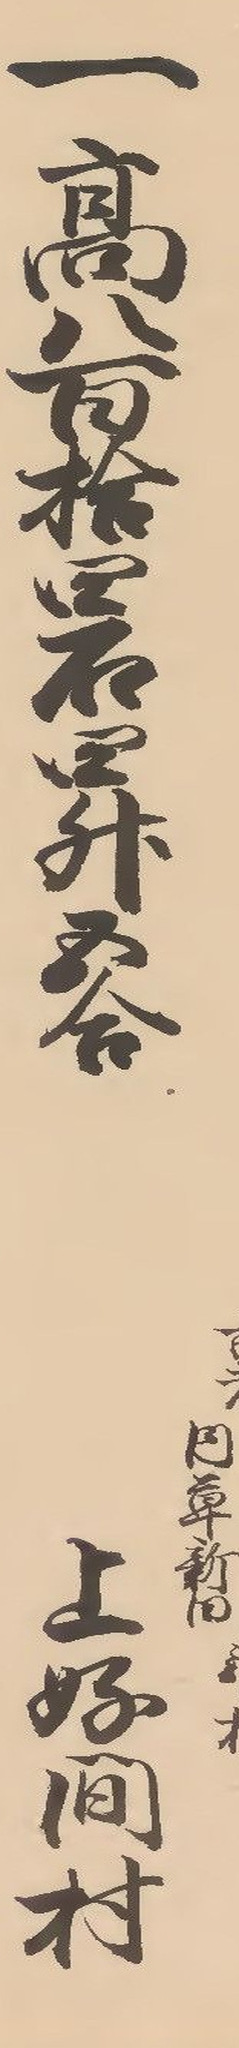一高八百拾四石四升五合上好間村
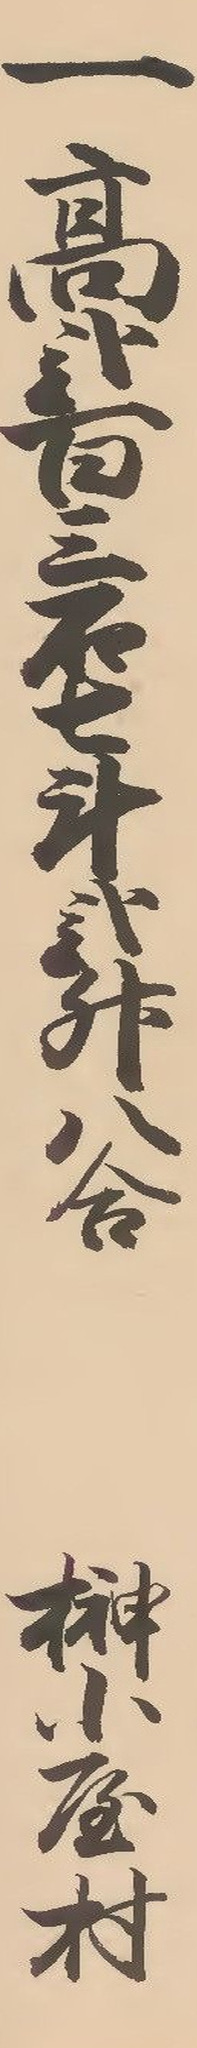一高弐百三石七斗弐升八合榊小屋村
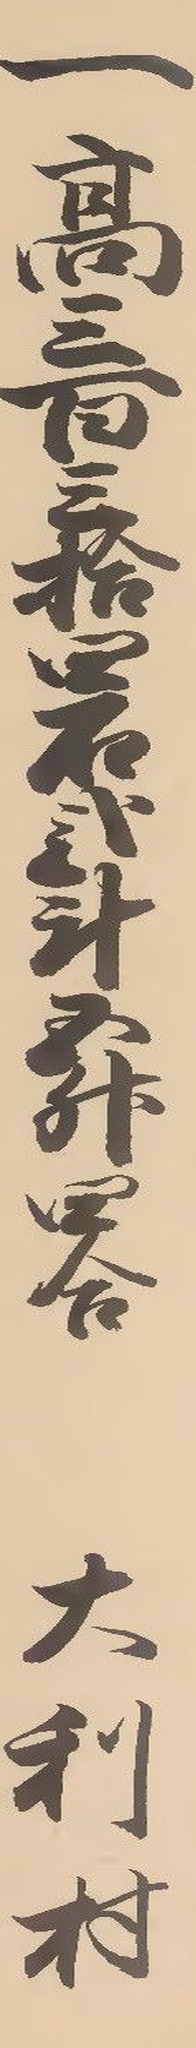一高三百三拾四石弐斗五升四合大利村
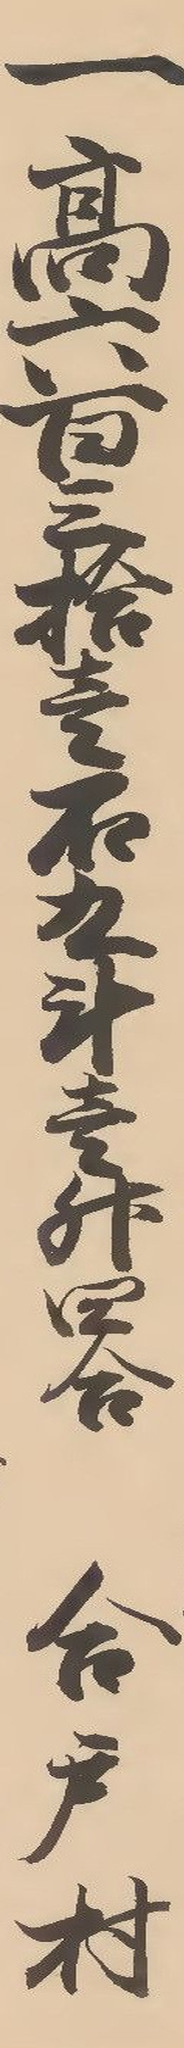一高六百三拾壱石九斗壱升四合合戸村
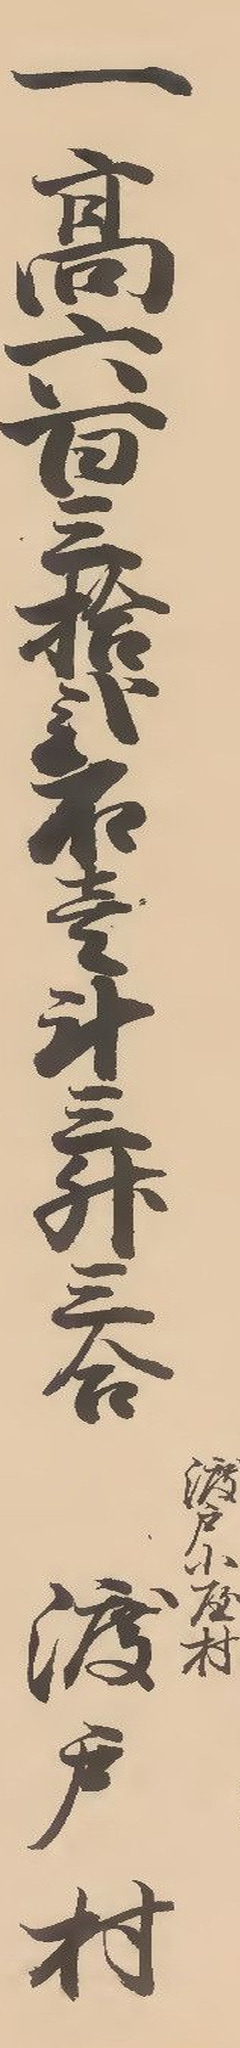一高六百三拾弐石壱斗三升三合渡戸村
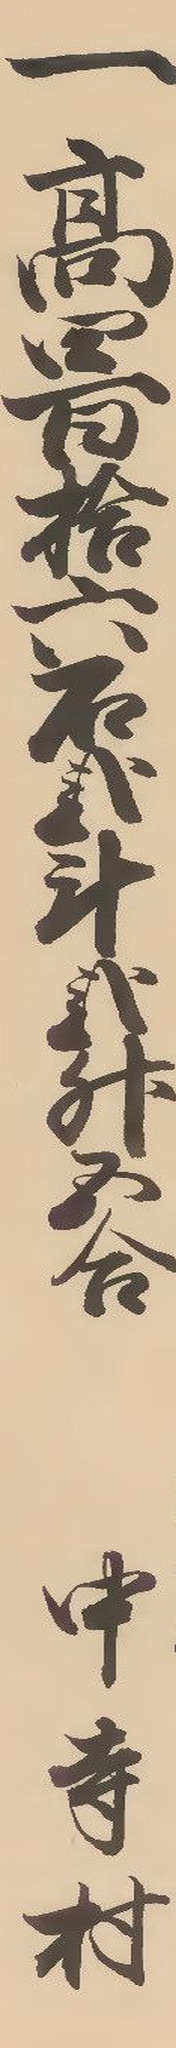一高四百拾六石弐斗弐升五合中寺村

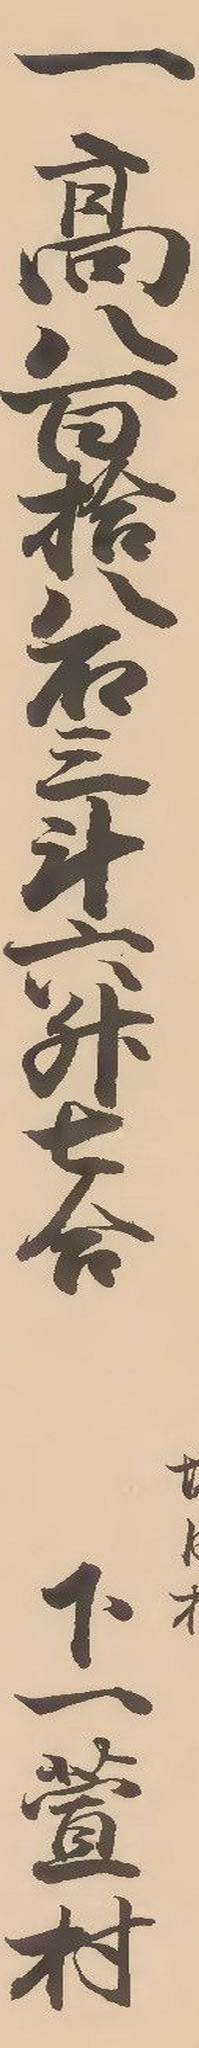一高八百拾八石三斗六升七合下一萱村
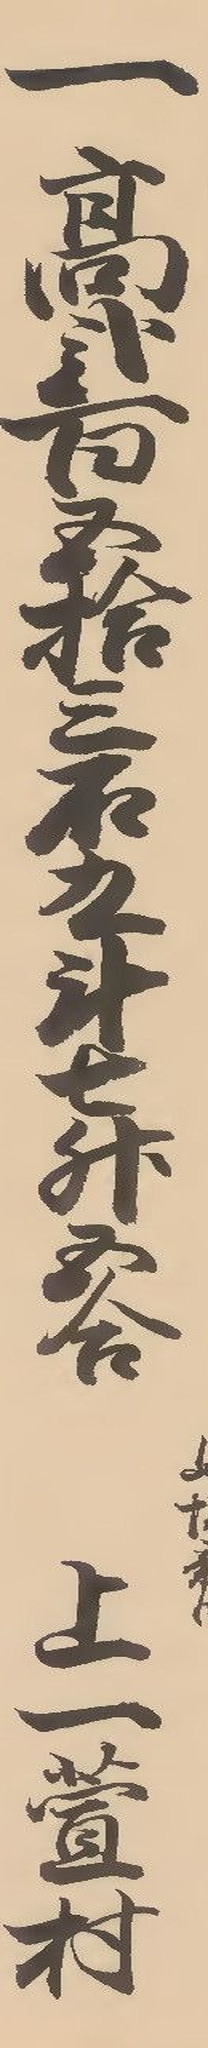一高弐百五拾三石九斗七升五合上一萱村
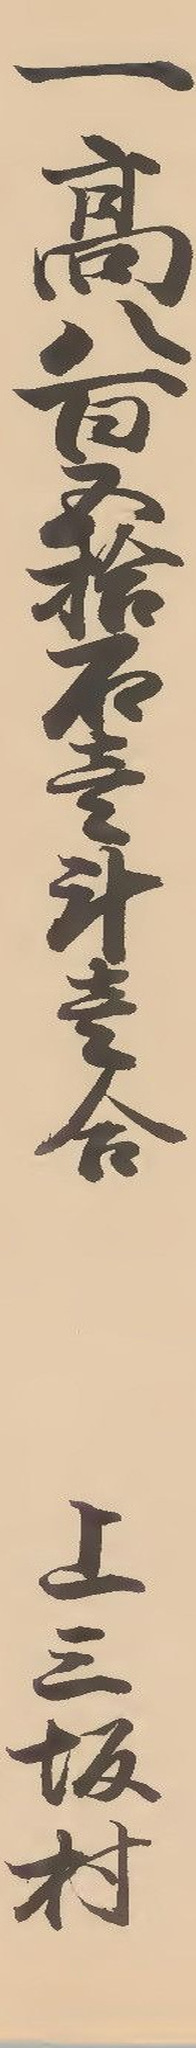一高八百五拾石壱斗壱合上三坂村
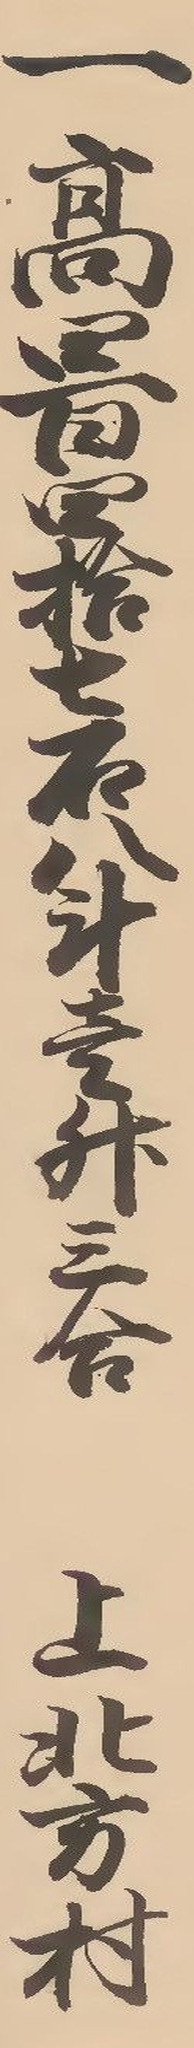一高四百四拾七石八斗壱升三合上北方村
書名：陸奥国郷帳　３
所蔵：国立公文書館 National Archives of Japan
